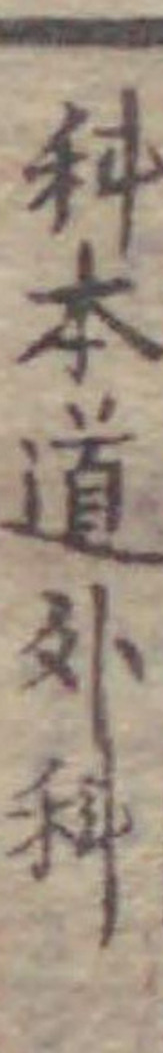科本道外科
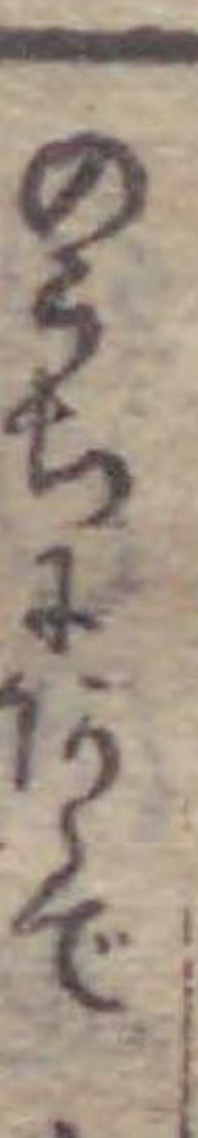のうちにあらで
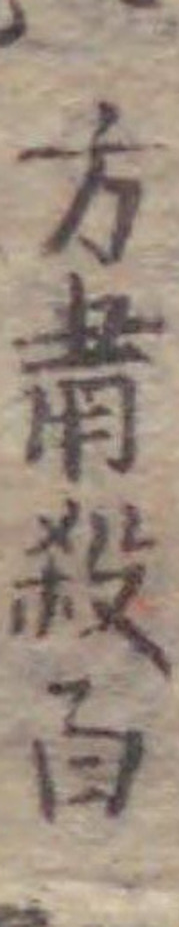方粛殺百
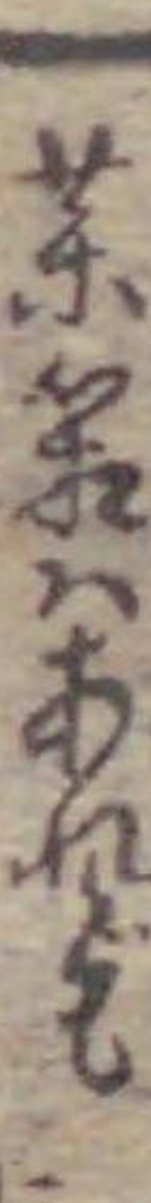薬箱ハあれども
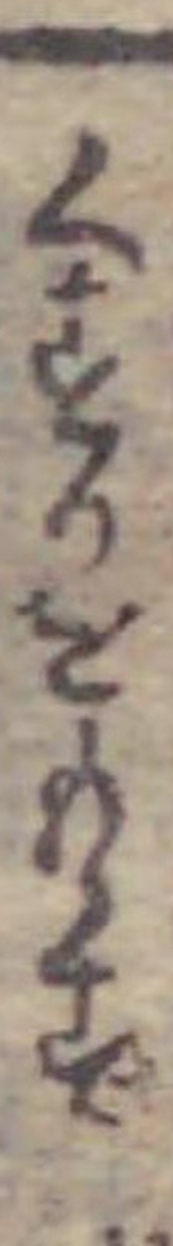くすりをもたず
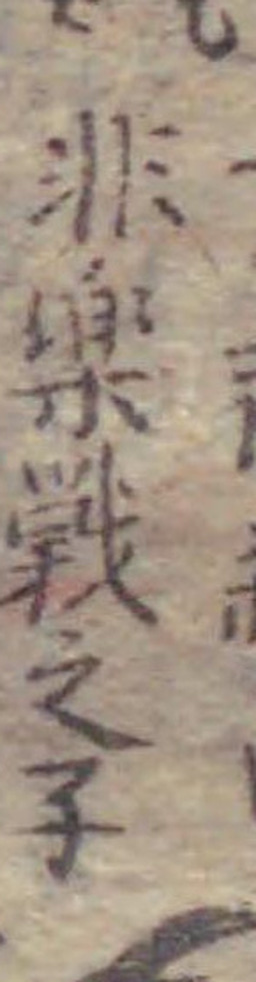非楽戦之子
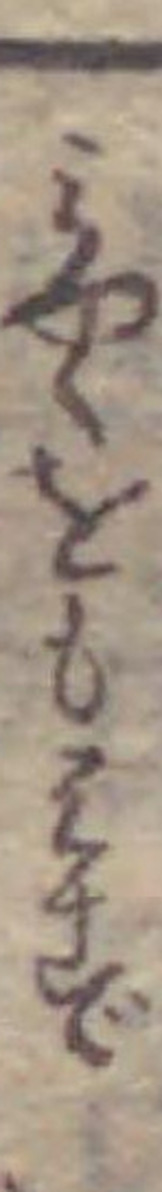みやくをもみず
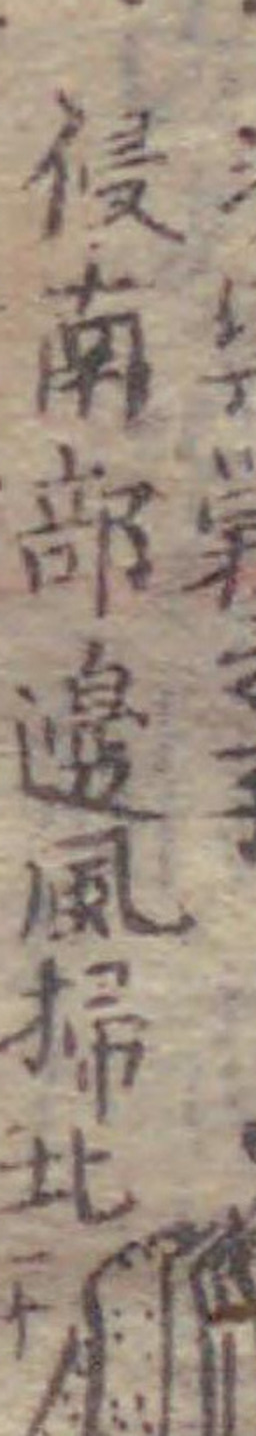侵南部邊風掃北
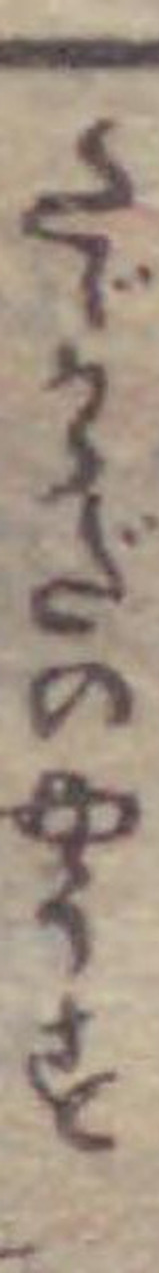ただからだのやうす
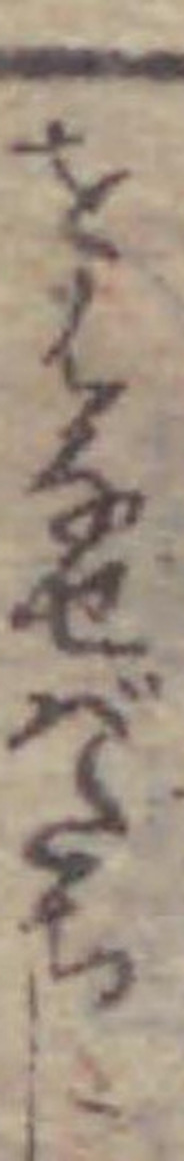をはなせばたち
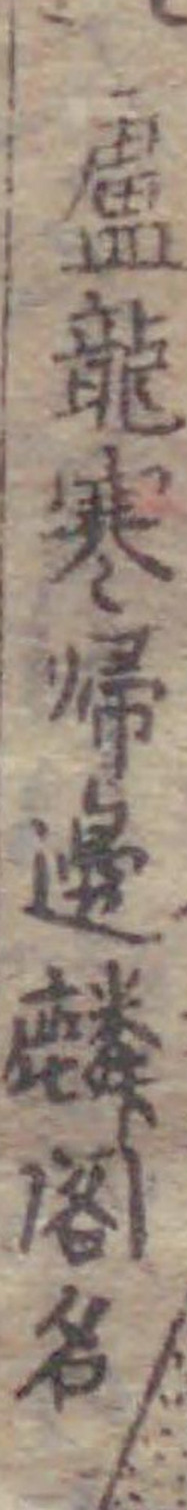盧龍寒帰邊麟閣名
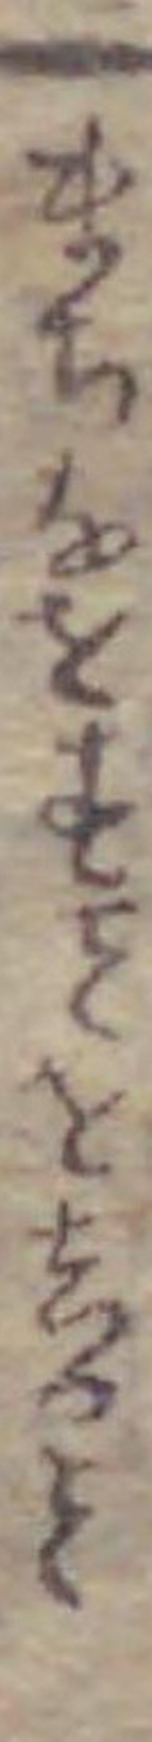まちなおすをことをしること
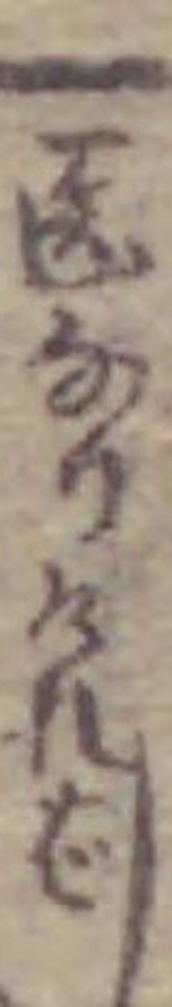医なりければ
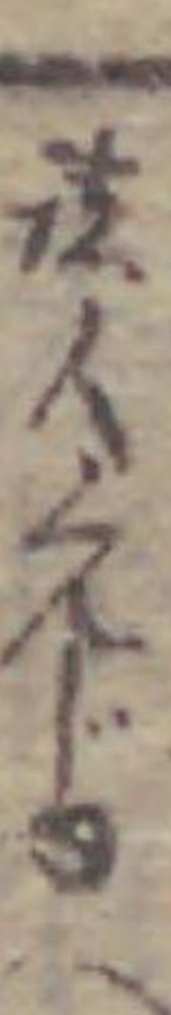諸人くんじゆ
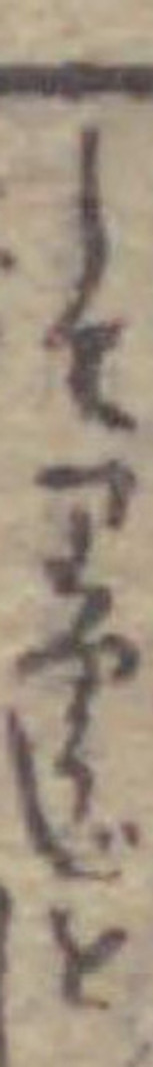してりやうじを
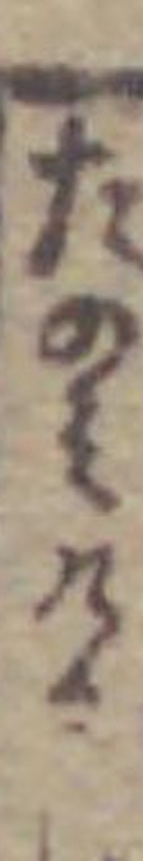たのみける
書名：五躰不具毒解薬 : 3巻
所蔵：国立国会図書館 National Diet Library, JAPAN
